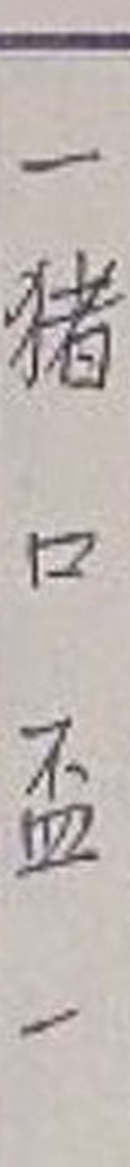一猪口盃四
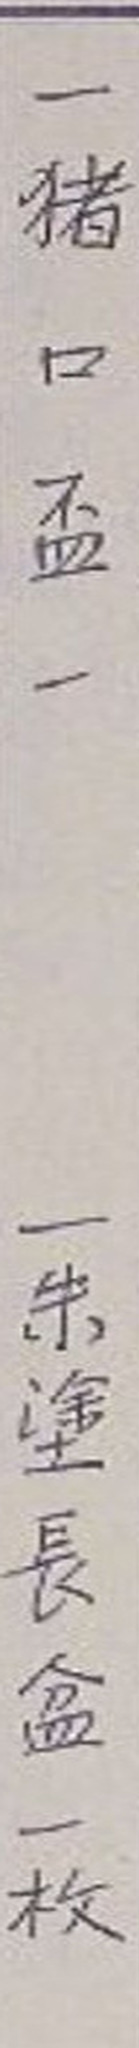一猪口盃一一朱塗長盆一枚
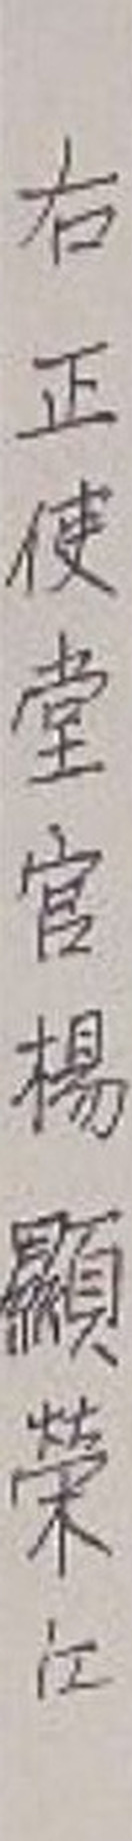右正使堂官楊顕栄え

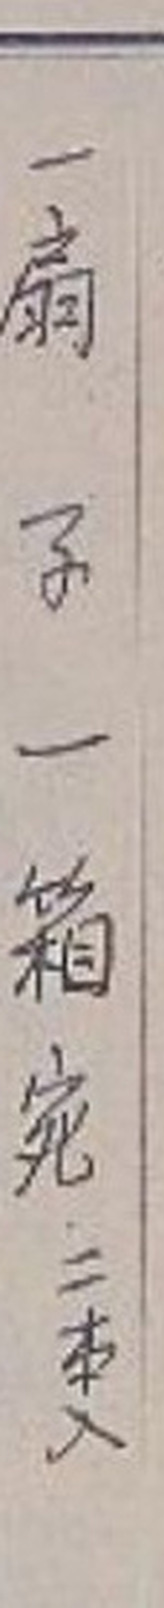一扇子一箱宛二本入一手拭一筋宛
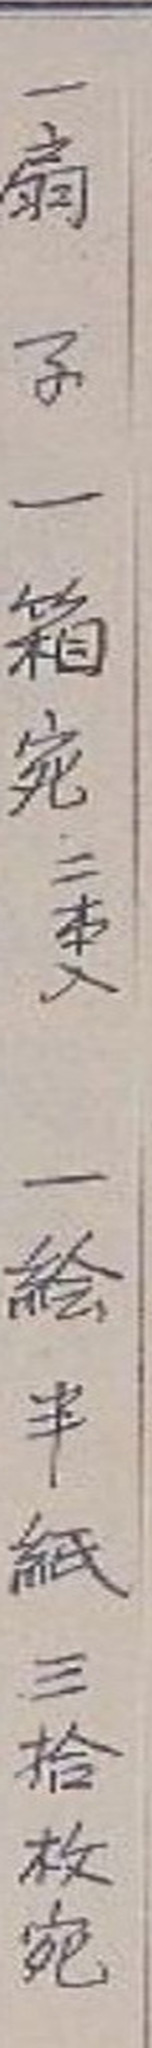一扇子一箱宛二本入一絵半紙三拾枚宛
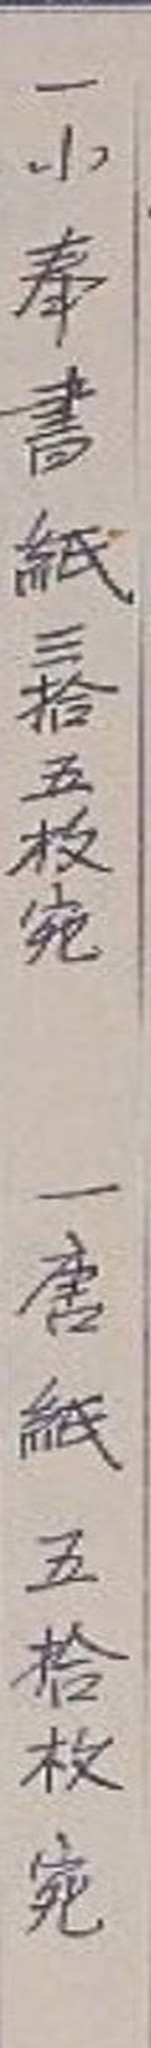一小奉書紙三拾五枚宛一唐紙五拾枚宛
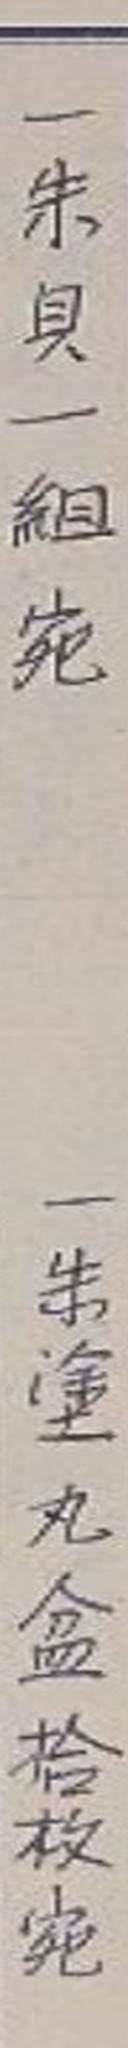一朱貝一組宛一朱塗丸盆拾枚宛
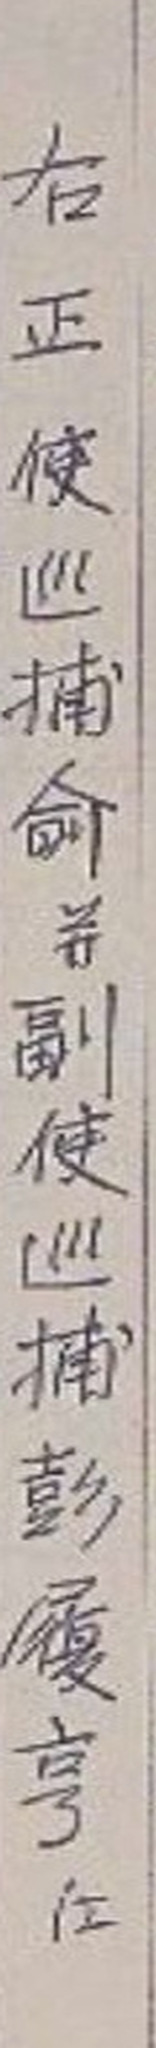右正使巡捕兪桂并副使巡捕彭履亨え
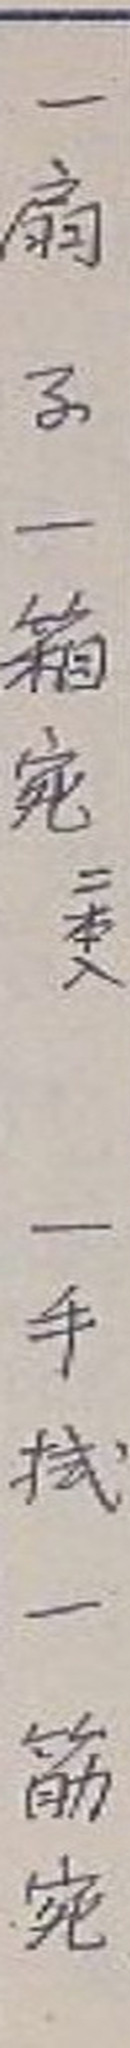一扇子一箱宛二本入一手拭一筋宛
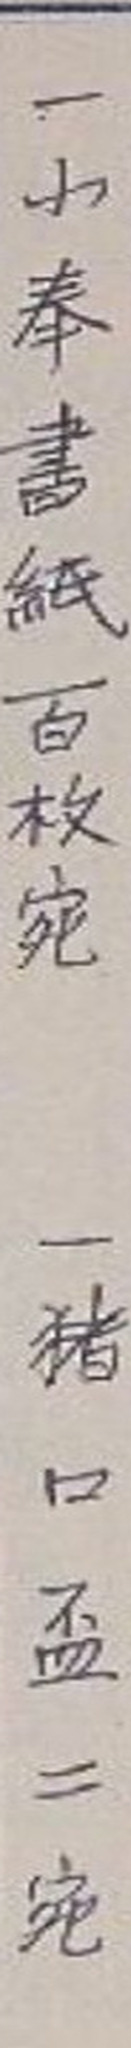一小奉書紙百枚宛一猪口盃二宛
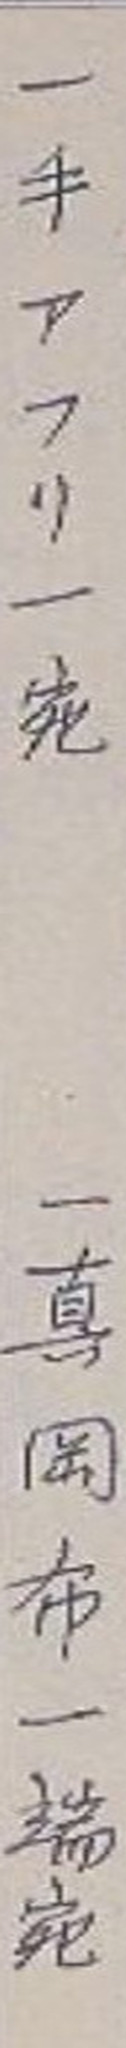一手あふり一宛一真岡布一端宛
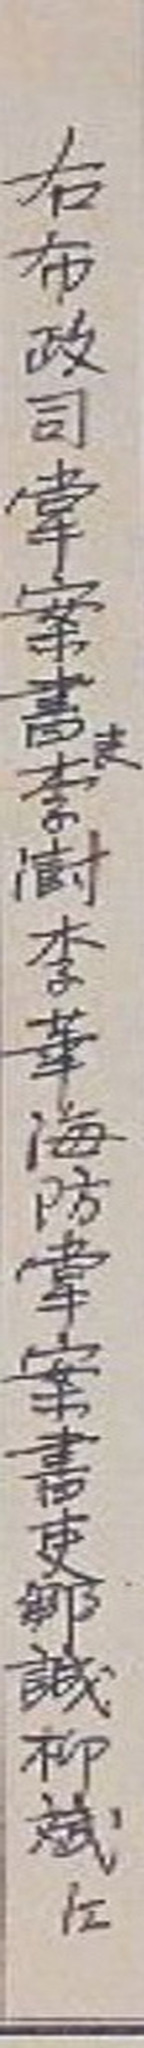右布政司掌案書吏李澍并李華海防掌案書吏鄒誠并柳斌え
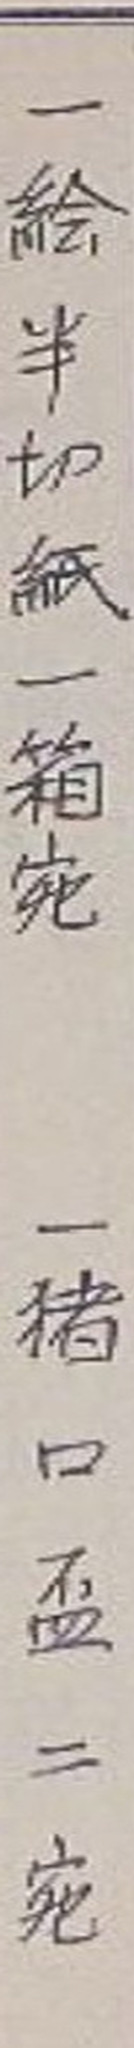一絵半切紙一箱宛一猪口盃二宛
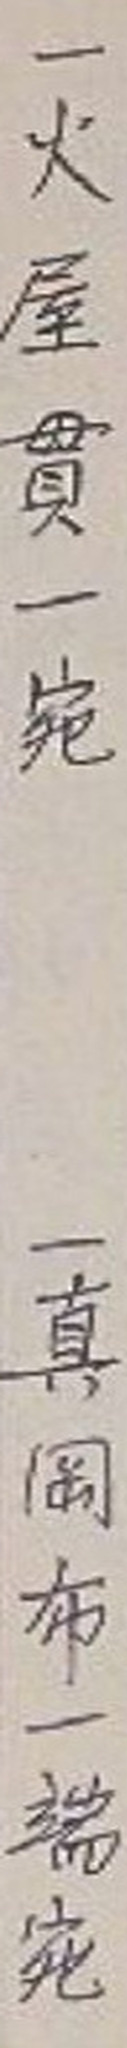一火屋貫一宛一真岡布一端宛
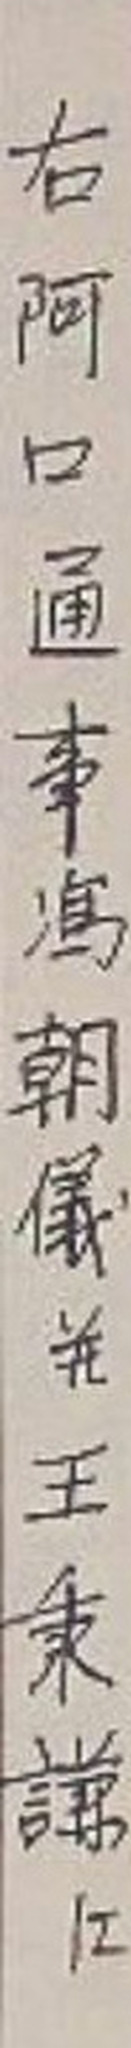右阿口通事馮朝儀并王秉謙え
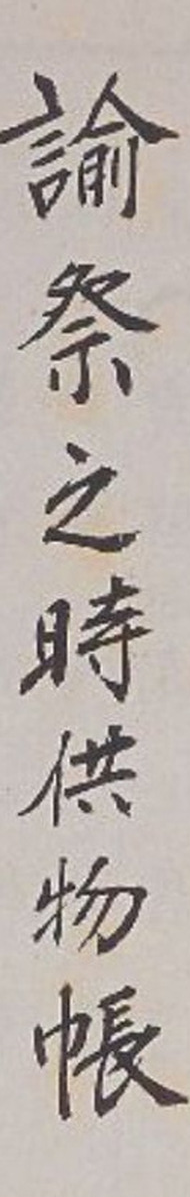諭祭之時供物帳
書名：支那冊封使来琉諸記 下巻
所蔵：University of the Ryukyus Library
